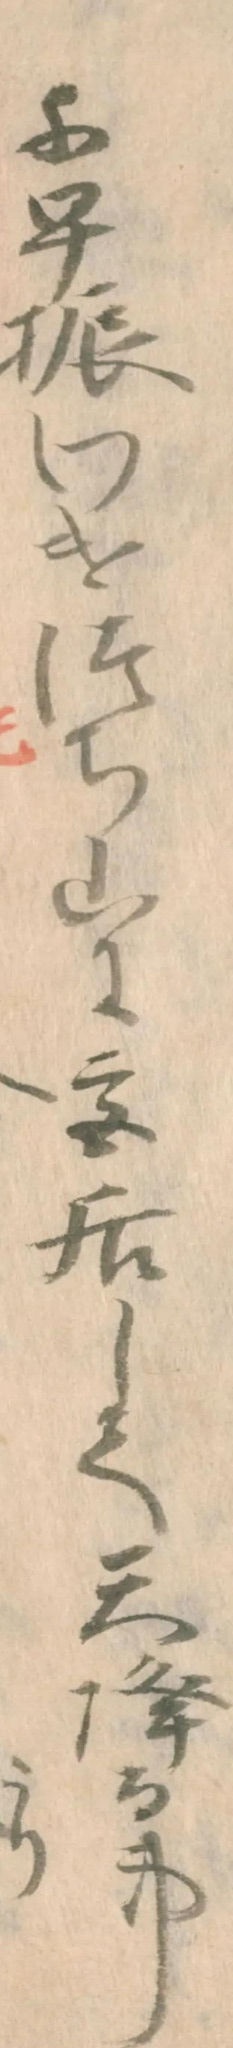千早振わけつち山に宮居して天降る事
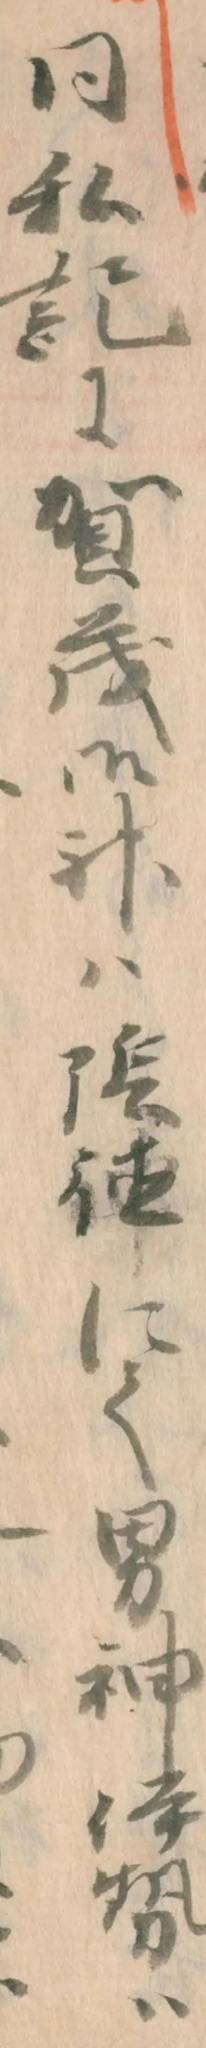同私記に賀茂御神は陰徳にて男神伊勢は
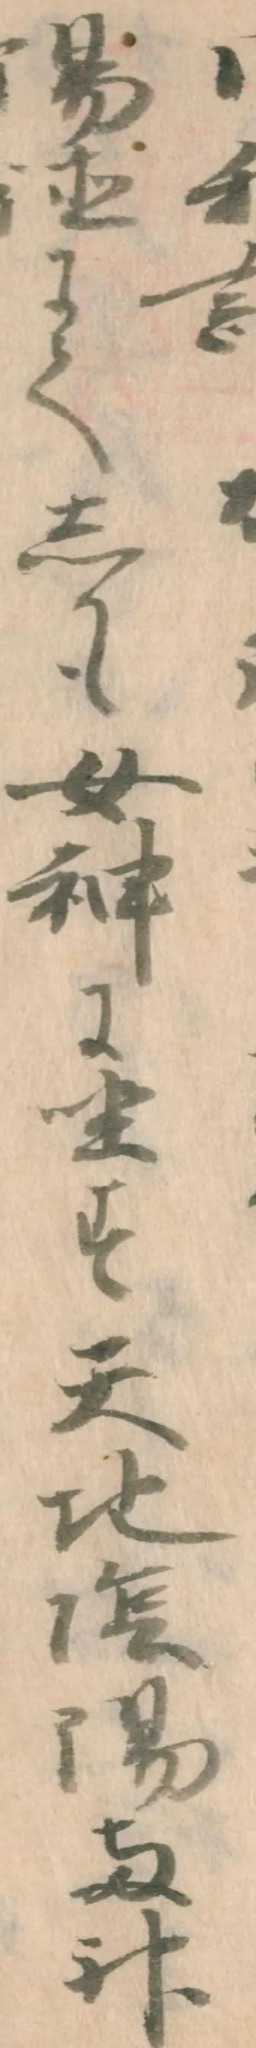陽徳にてしかも女神に坐す天地陰陽両神
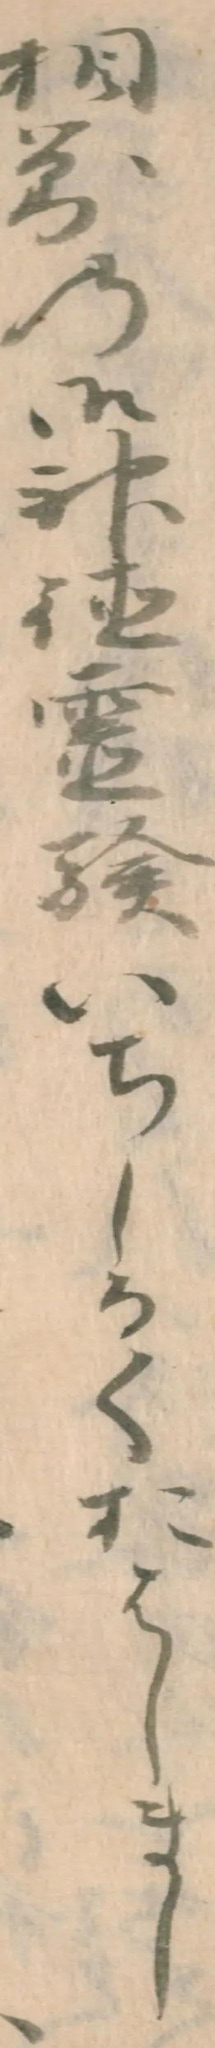相対の御神徳霊験いちしるくおはしまし
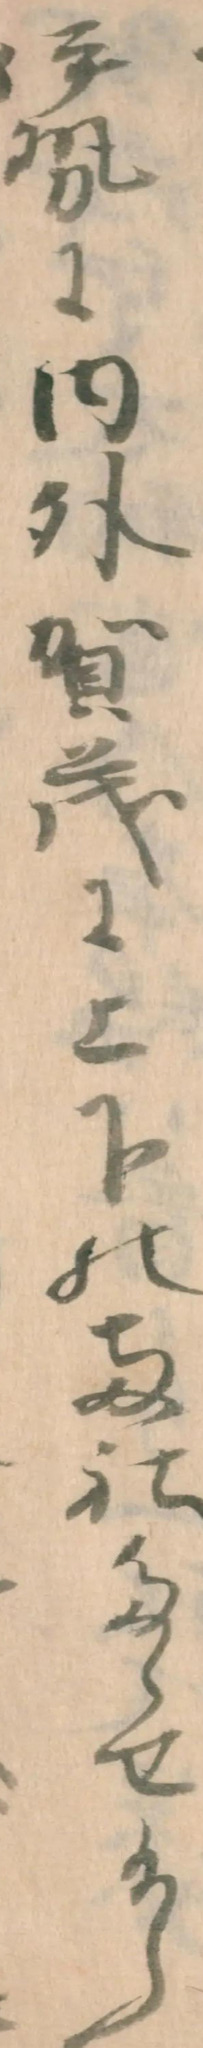伊勢に内外賀茂に上下の両社たゝせ給ふ
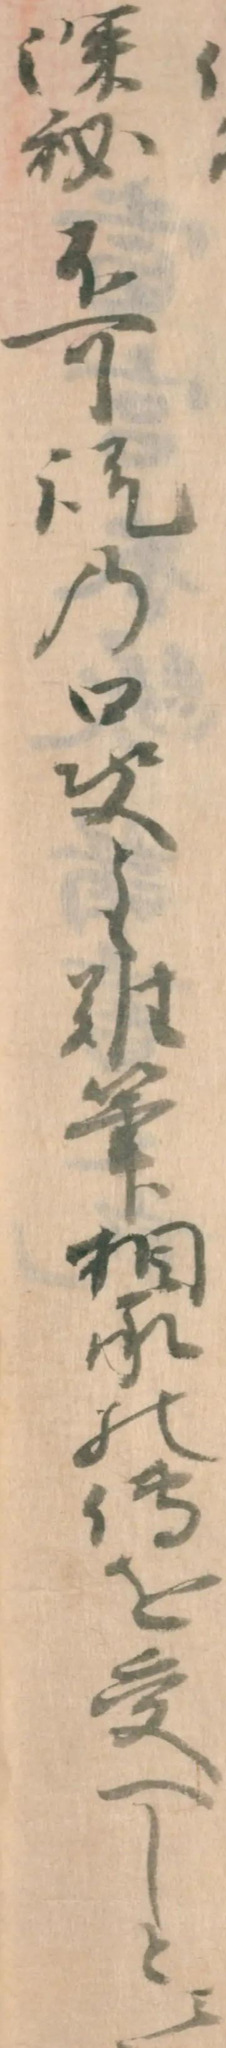深秘不可説の口決とも難筆相承の伝を受へしと云々
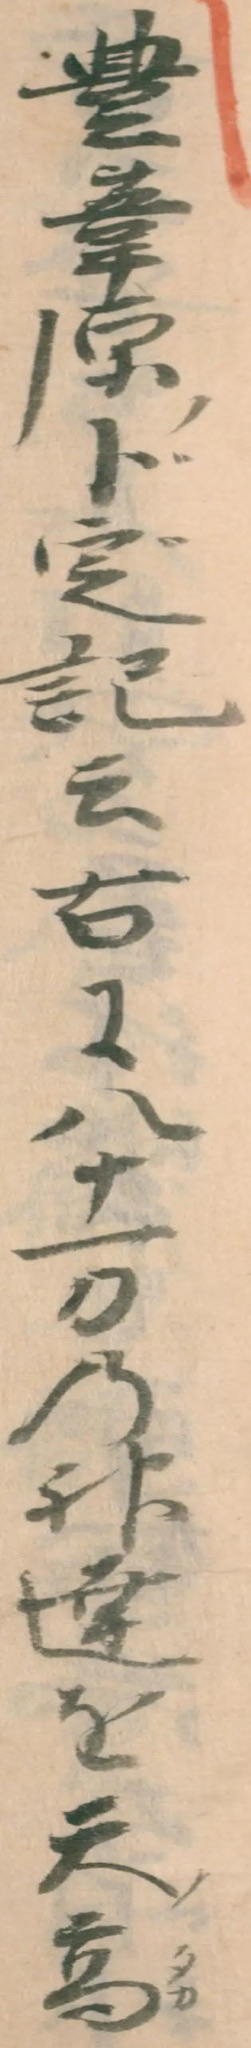豊葦原卜定記云古に八十万の神達を天高
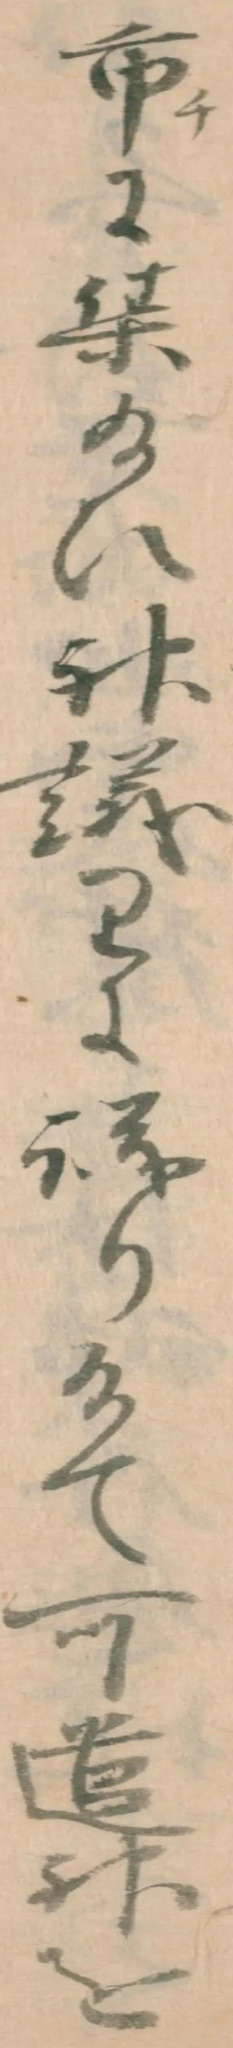市に集給ひ神議りに議り給て可遣神を
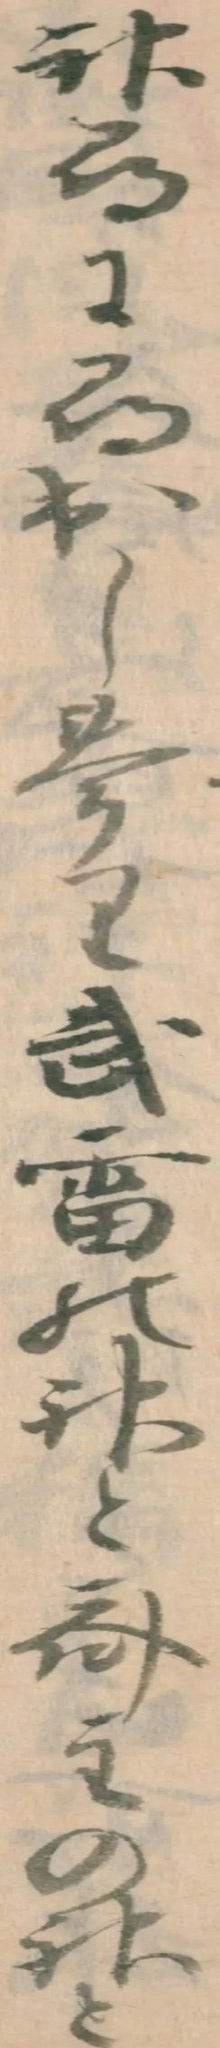神尋に尋出し奉り武雷の神と斎主の神と
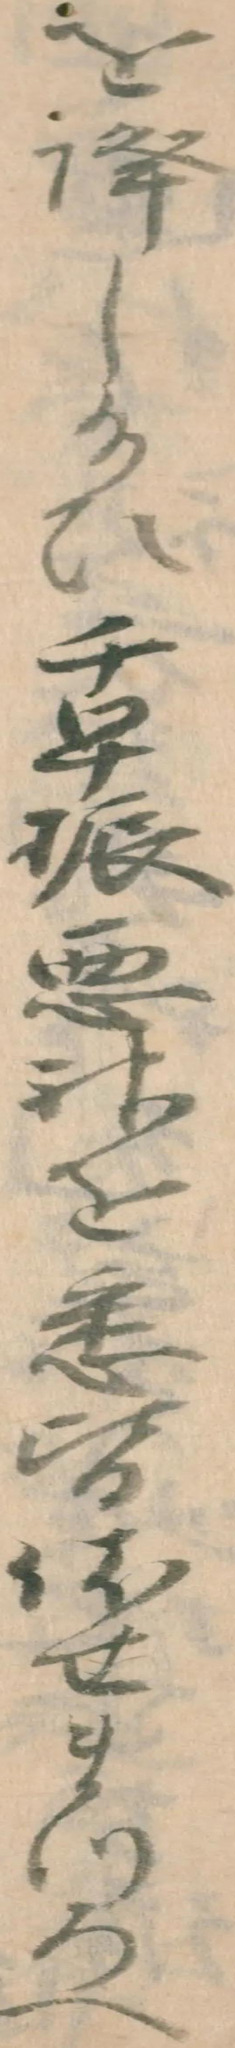を降し給ひ千早振悪神を悉皆伏せまつろへ
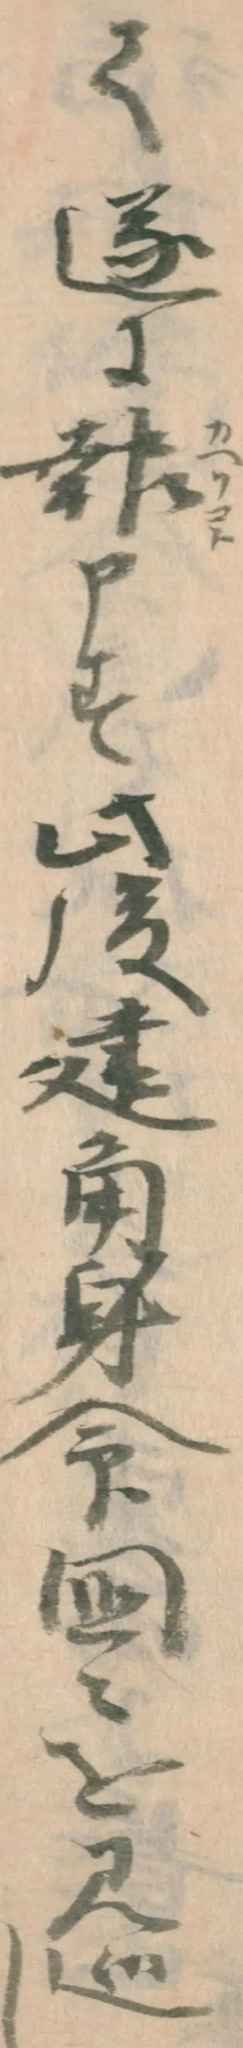て遂に報申す此後建角身命国々を見巡し
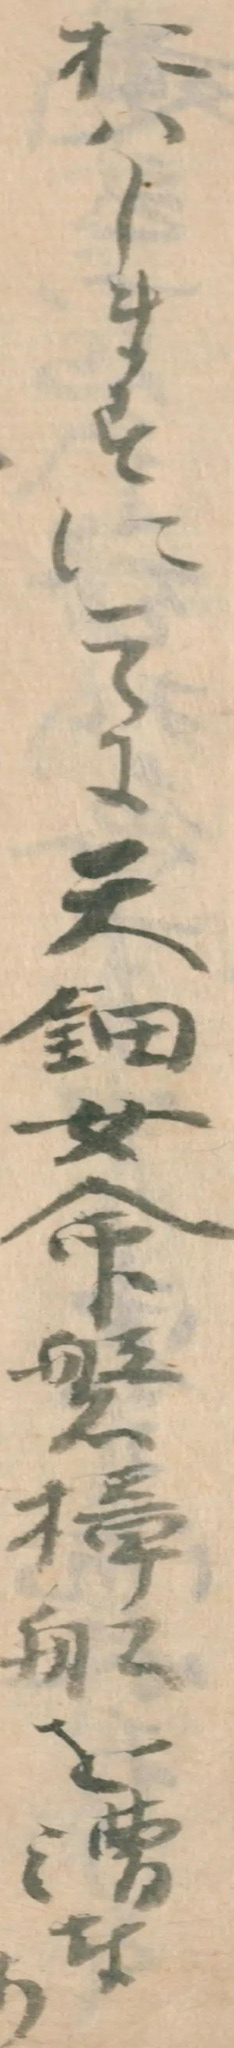おはしますにこゝに天鈿女命磐樟船を漕奉り
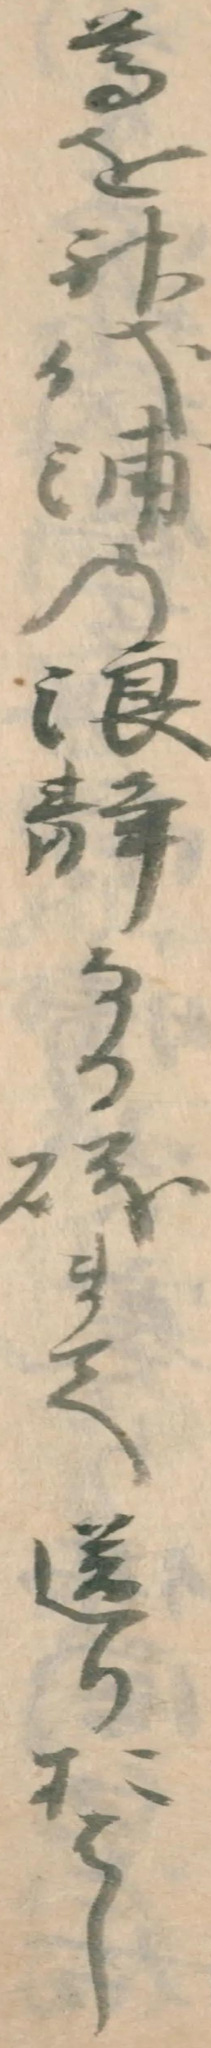尊を神代浦の浪静なる磯まて送りおはし
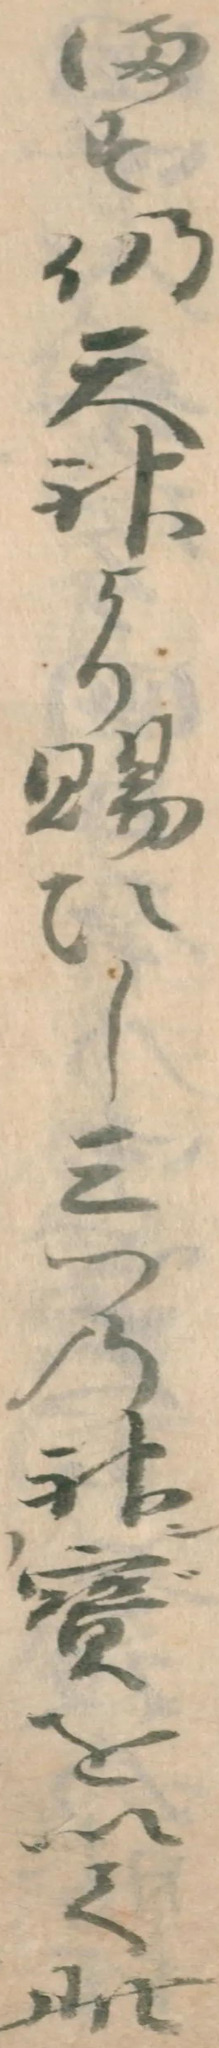ます仍天神より賜ひし三ツの神-宝を以て此
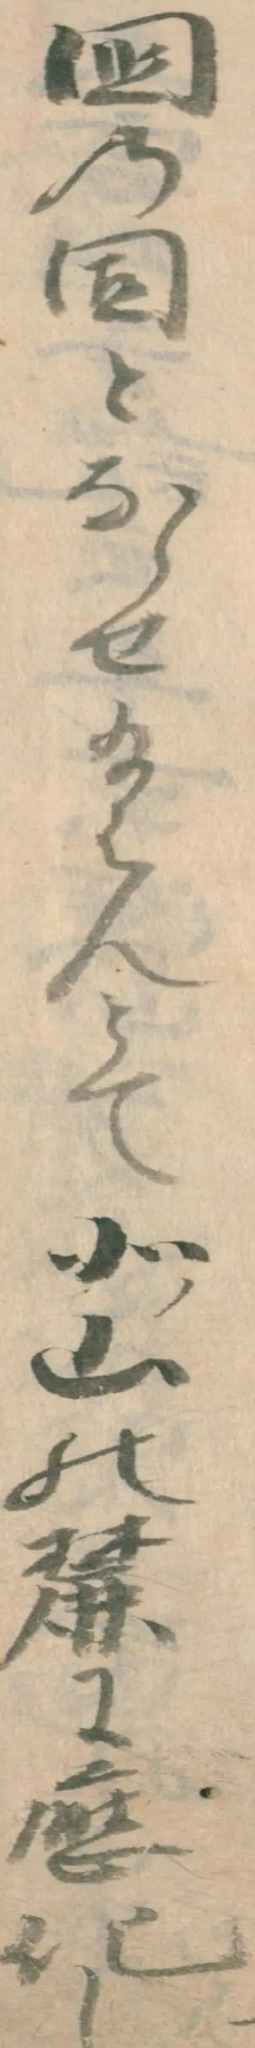国の固とならせ給はんとて北山の麓に応化し
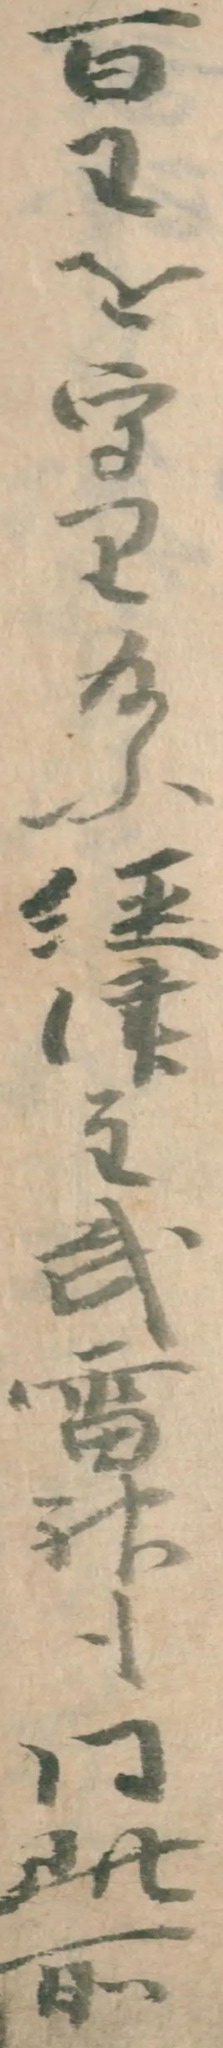百王を守り給ふ経津主武雷神も同此所に
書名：賀茂社記録. 第1冊
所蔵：国立国会図書館 National Diet Library, JAPAN
